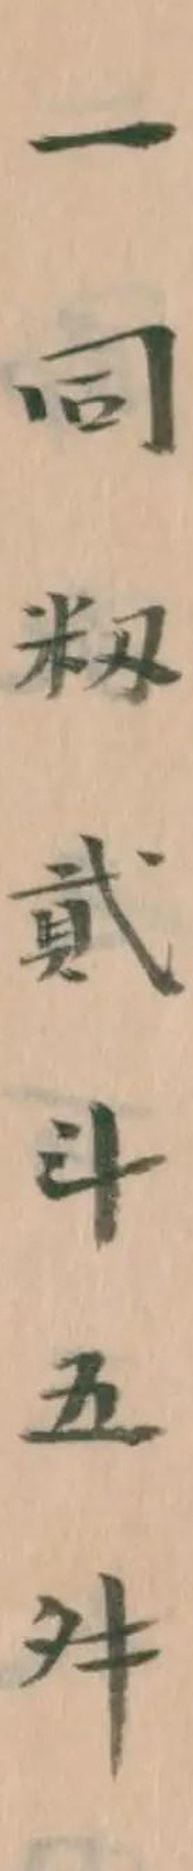一同籾貮斗五升
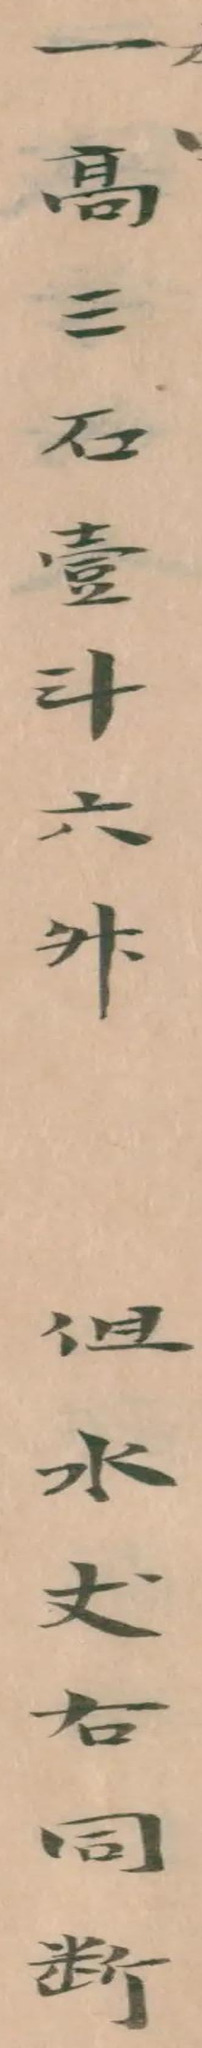一高三石壹斗六升但水丈右同断
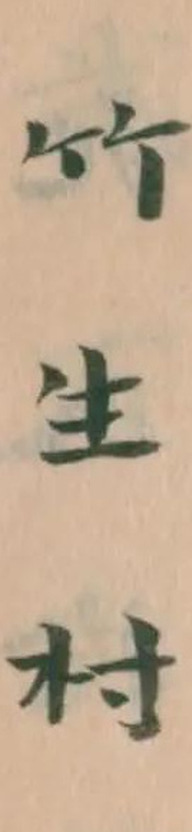竹生村
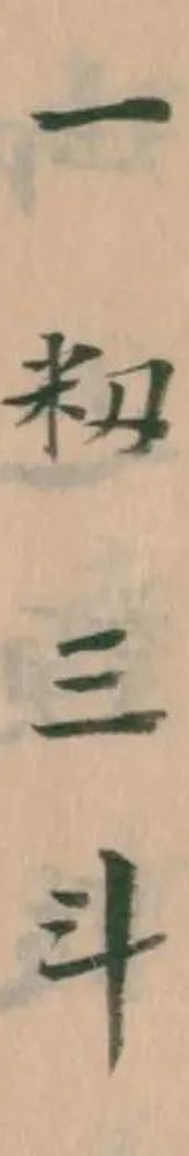一籾三斗
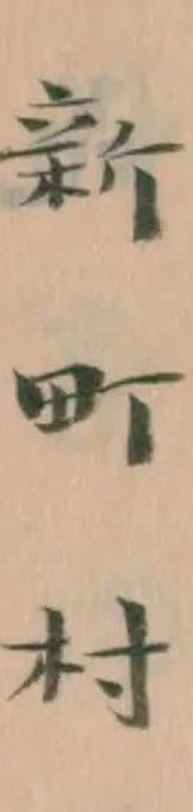新町村
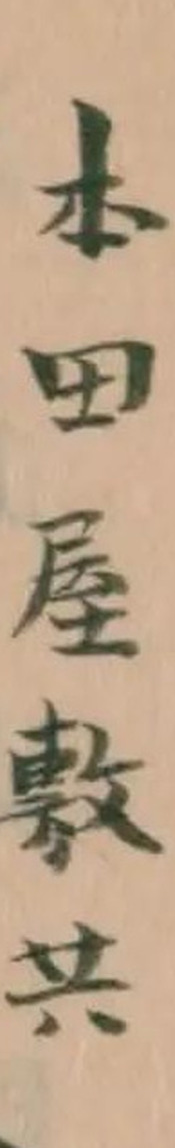本田屋敷共
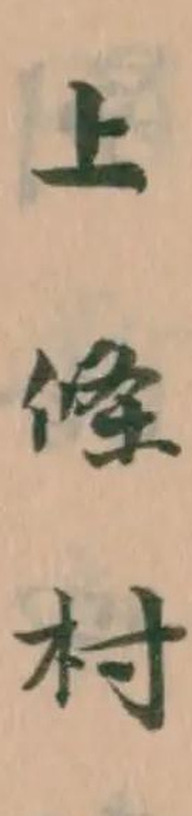上條村
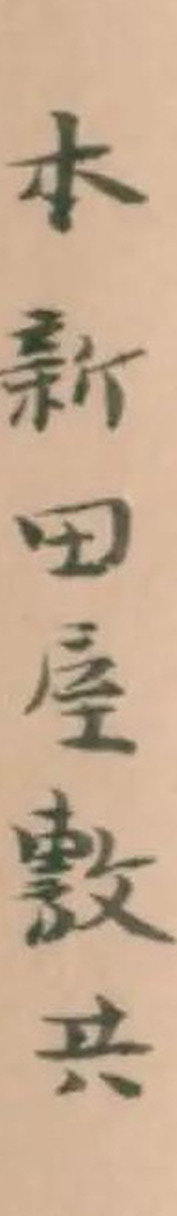本新田屋敷共
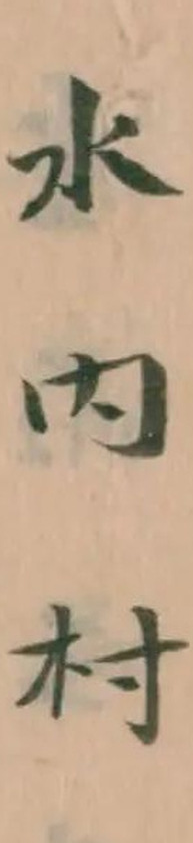水内村
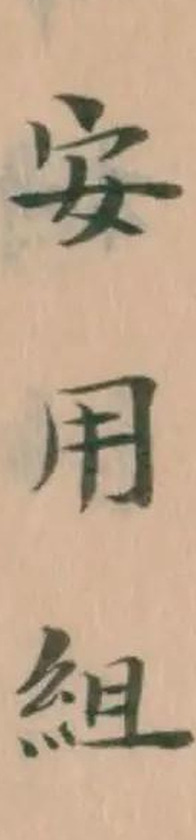安用組
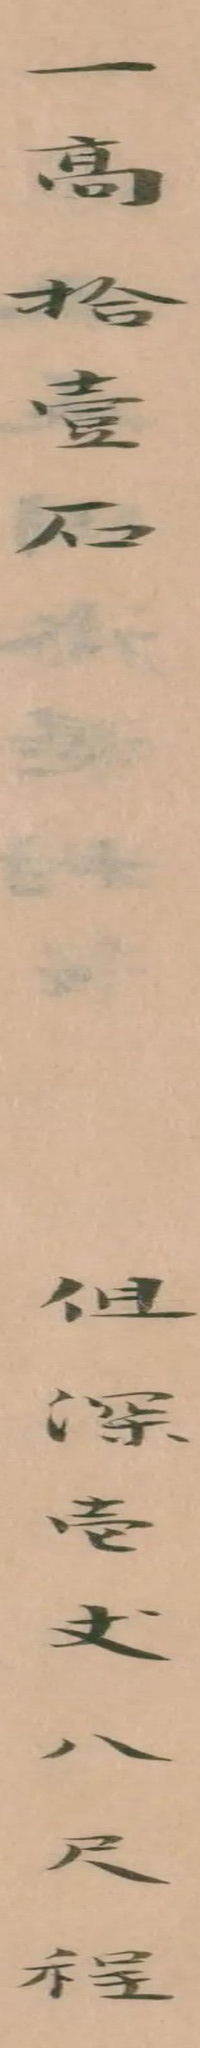一高拾壹石但深壱丈八尺程
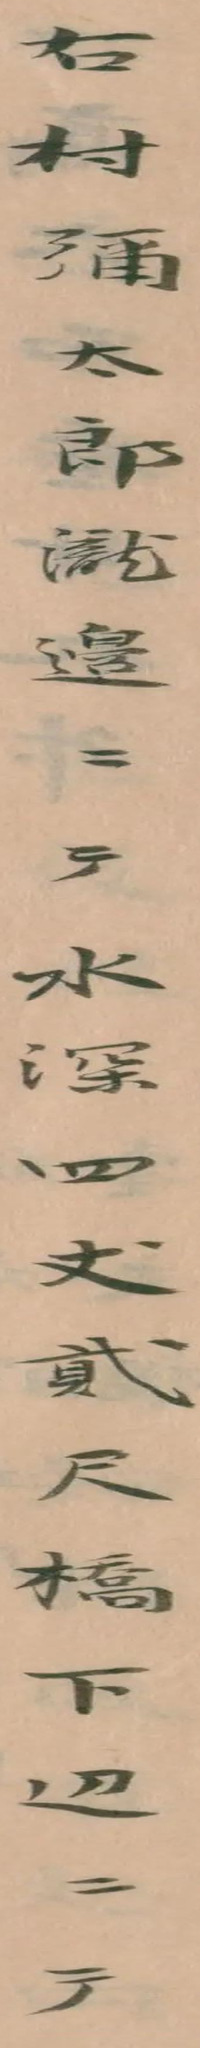右村弥太郎瀧辺ニテ水深四丈貮尺橋下辺ニテ
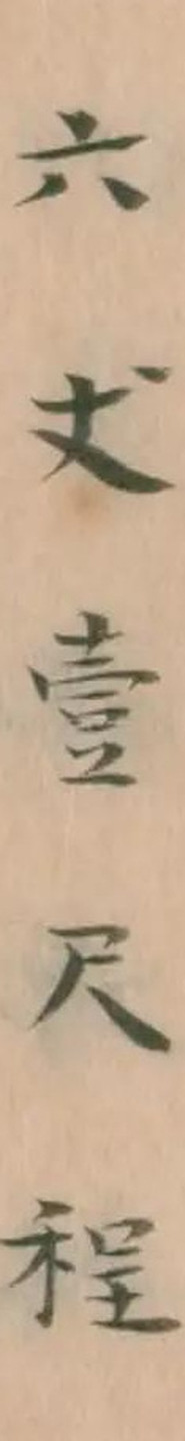六丈壹尺程
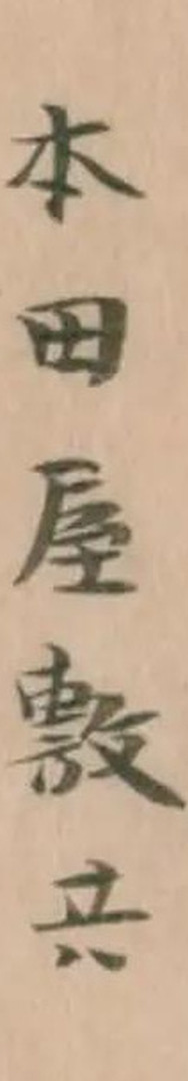本田屋敷共

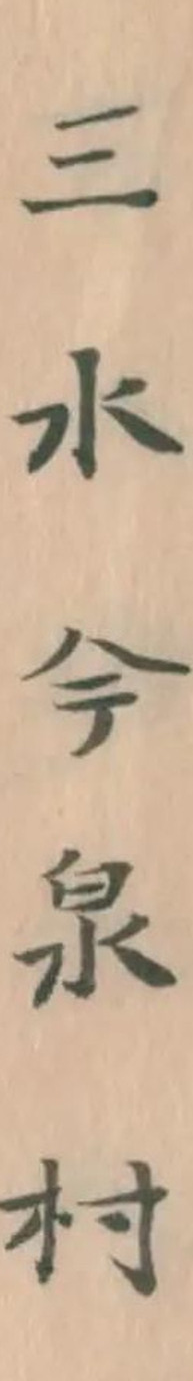三水今泉村
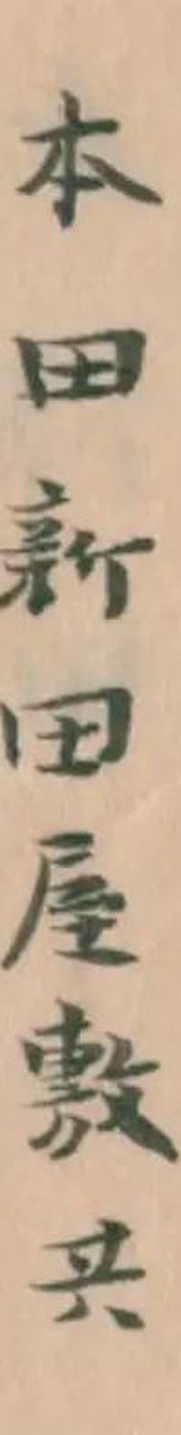本田新田屋敷共
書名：地災撮要. 巻5-6(地震之部)
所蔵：国立国会図書館 National Diet Library, JAPAN
